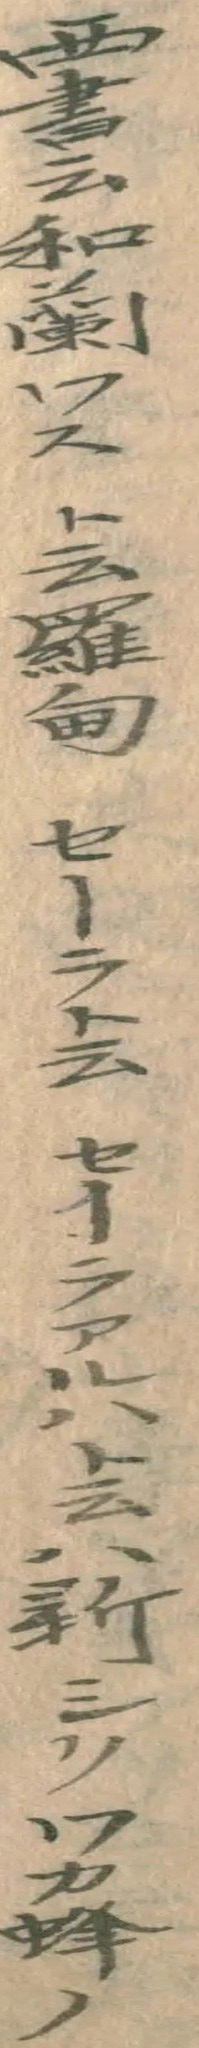西書云和蘭ワスト云羅甸セーラト云セーラアルハト云ハ新シクワカ蜂ノ
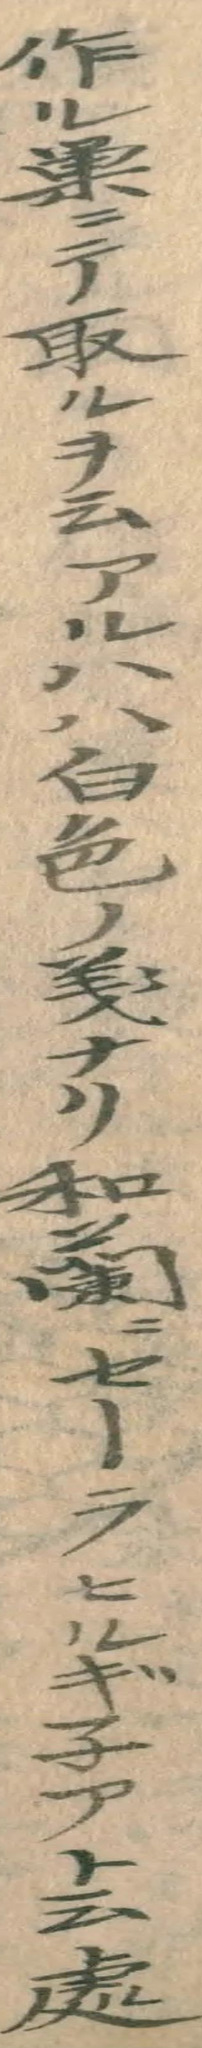作ル巣ニテ取ルヲ云アルハハ白色ノ義ナリ和蘭ニセーラヒルギネアト云處
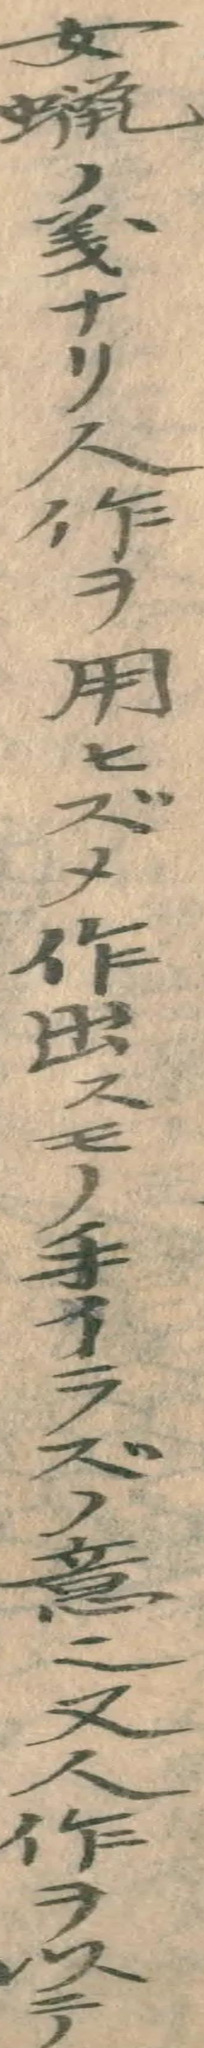女蠟ノ義ナリ人作ヲ用ヒズシテ作出スモノ手イラズノ意也又人作ヲ以テ
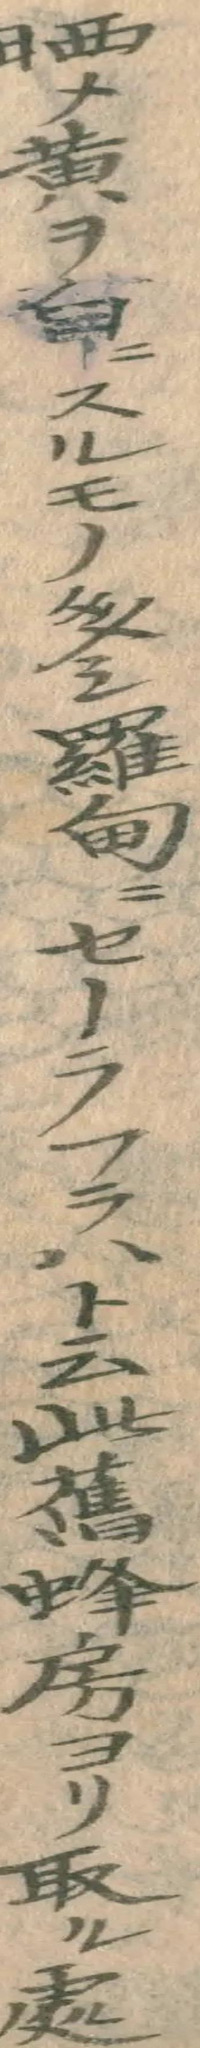晒シテ黄ヲ白ニスルモノ多シ羅甸ニセーラフラハト云此舊蜂房ヨリ取ル處
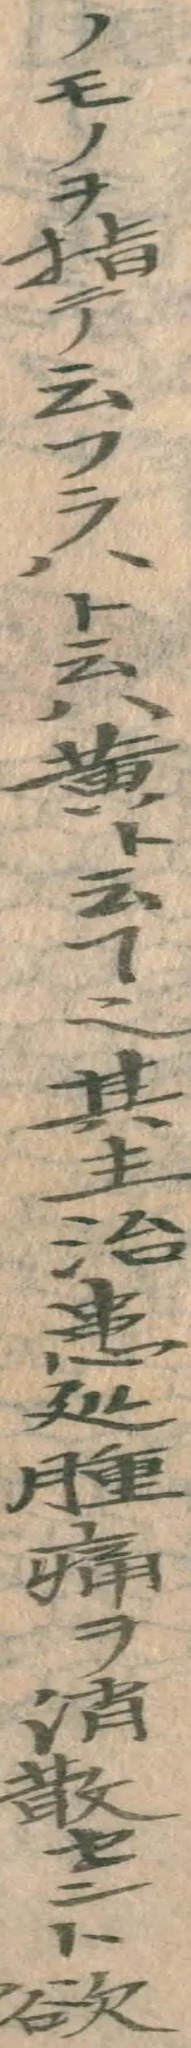ノモノヲ指テ云フラハト云ハ黄ト云コト也其主治患処腫痛ヲ消散シセント欲
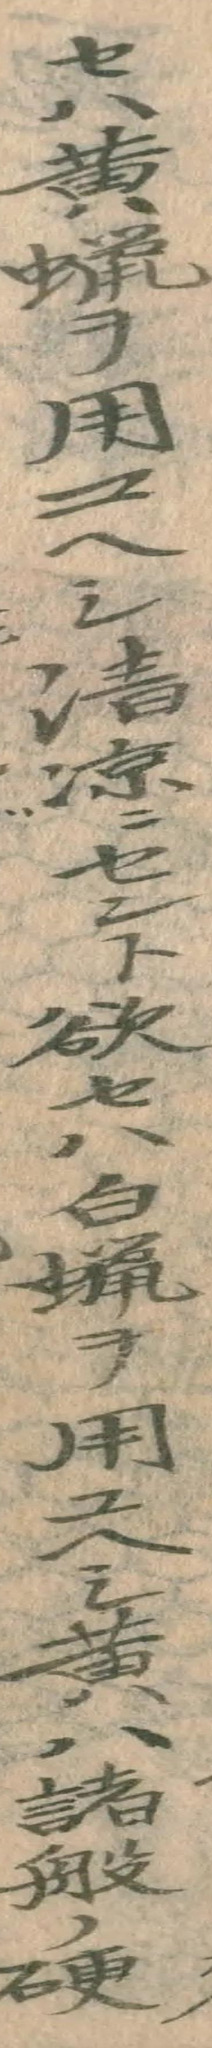セハ黄蠟ヲ用ユヘシ清涼ニセント欲セハ白蠟ヲ用ユヘシ黄ハ諸般ノ硬
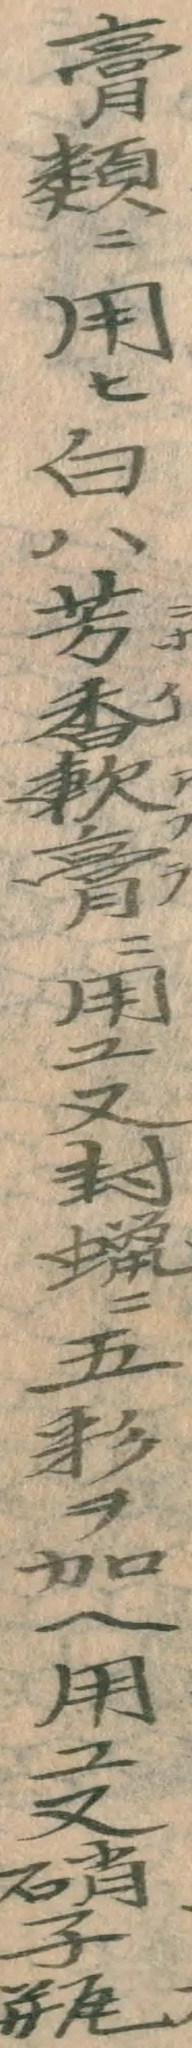膏類ニ用ヒ白ハ芳香軟膏ニ用ユ又封蠟ニ五彩ヲ加ヘ用ユ又硝子瓶
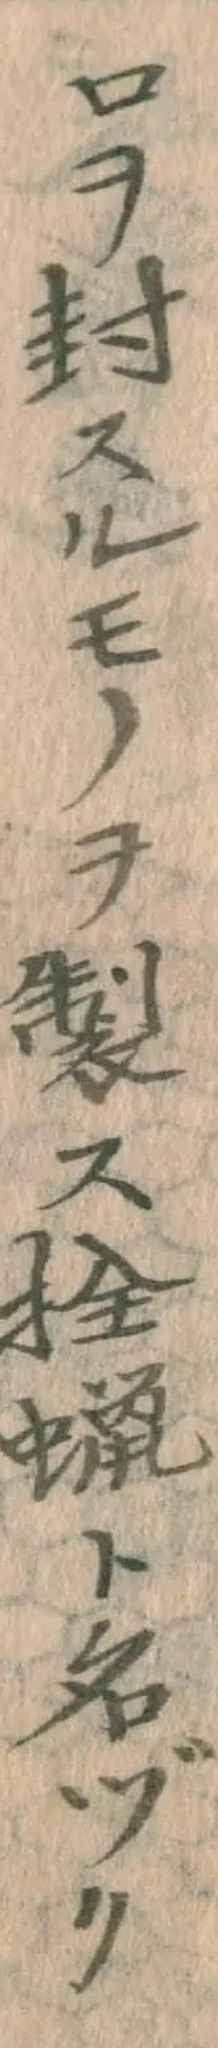口ヲ封スルモノヲ製ス拴蠟ト名ヅク
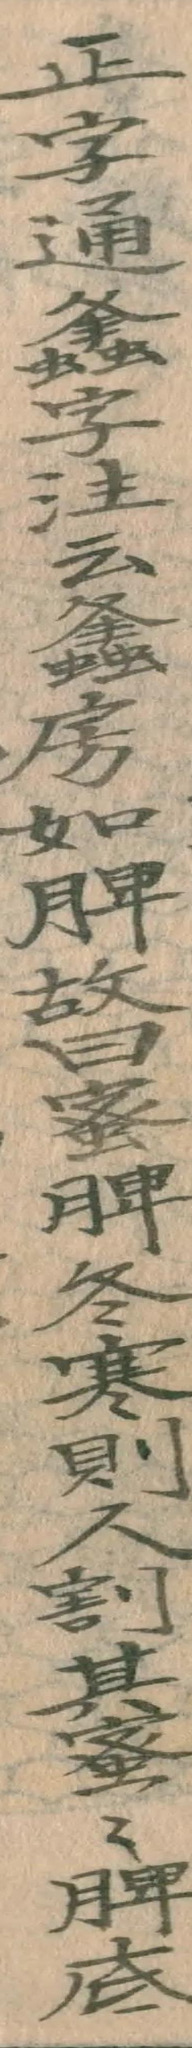正字通𧒒字注云𧒒房如脾故曰蜜脾冬寒則人割其蜜〻脾底
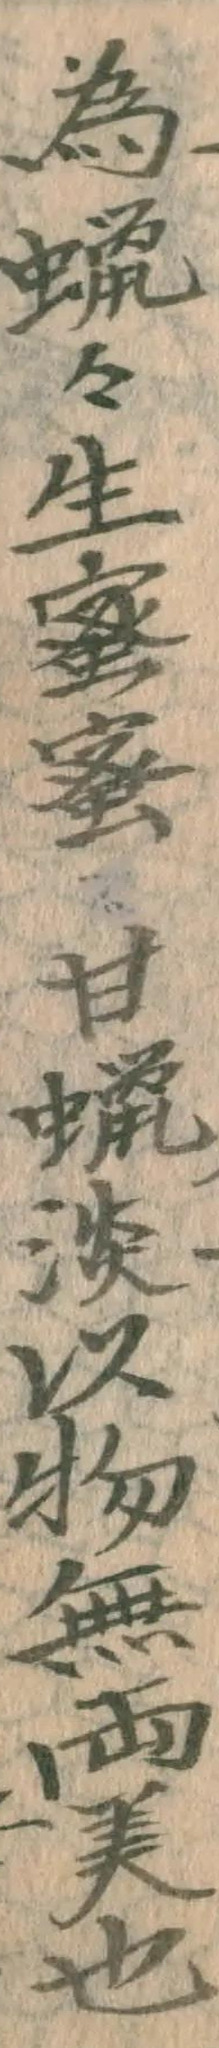為蠟々生蜜蜜甘蠟淡以物無両美也
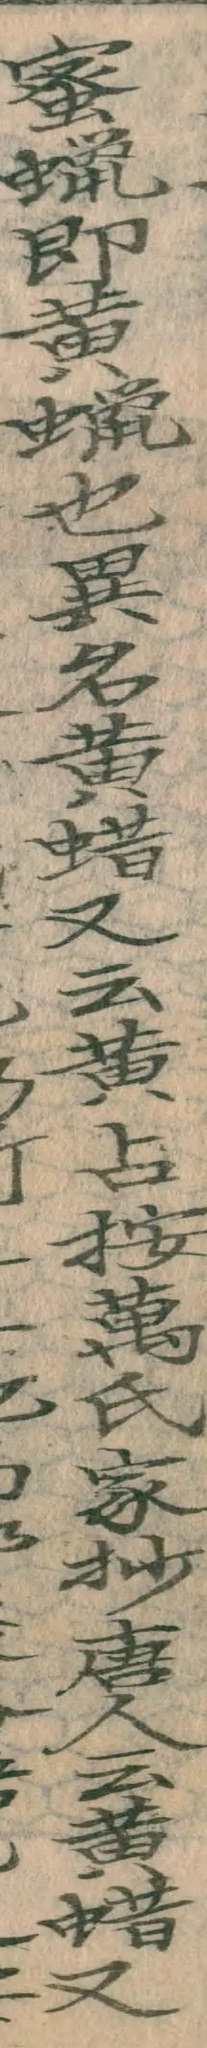蜜蠟即黄蠟也異名黄蜡又云黄占按萬氏家抄唐人云黄蜡又
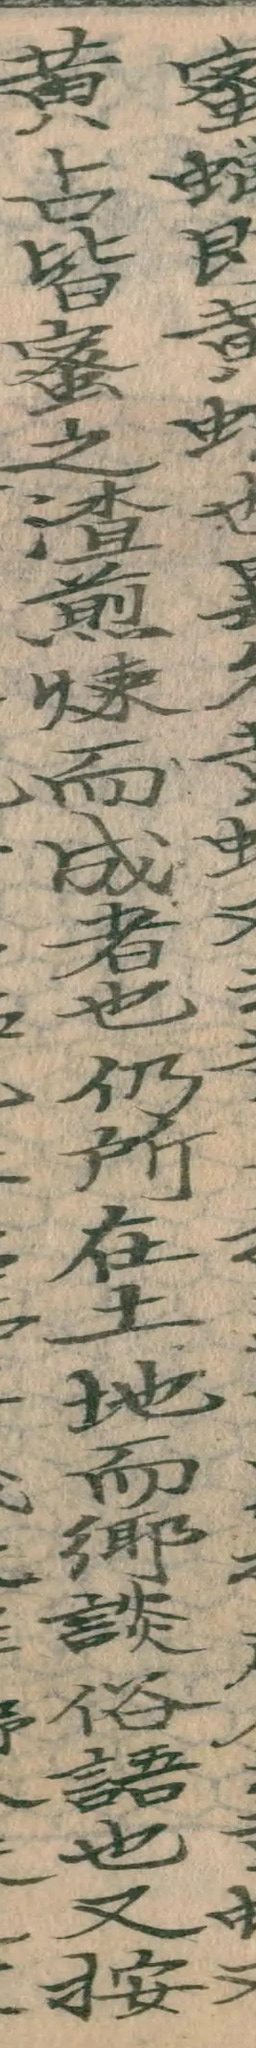黄占皆蜜之渣煎煉而成者也仍所在土地而郷談俗語也又按
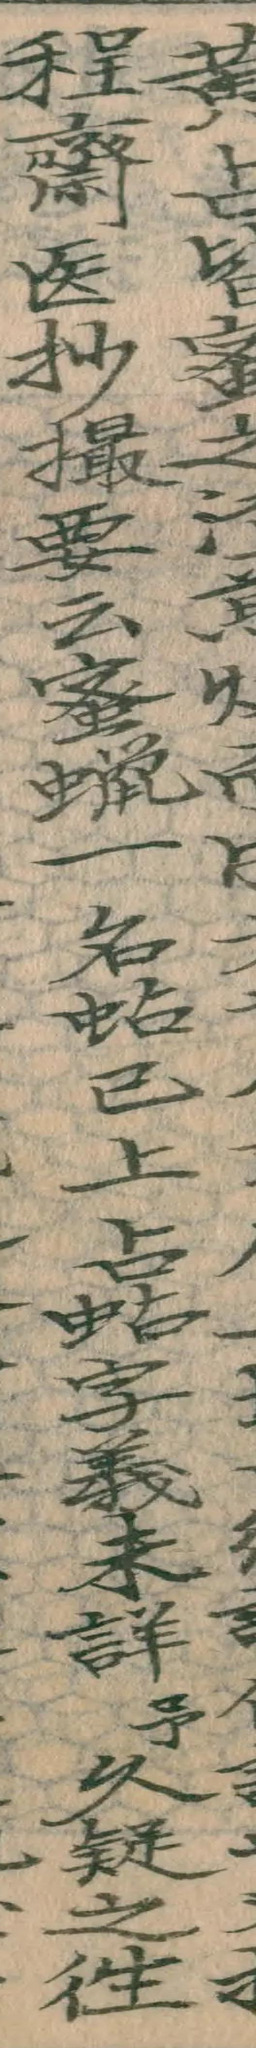程齋医抄撮要云蜜蠟一名蛅已上占蛅字義未詳予久疑之往
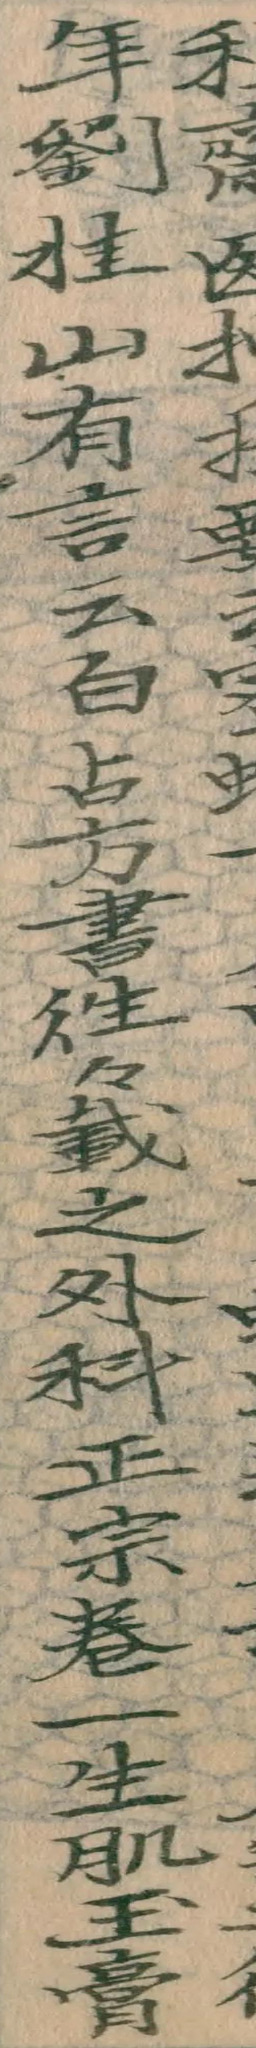年劉桂山有言云白占方書往々載之外科正宗巻一生肌玉膏
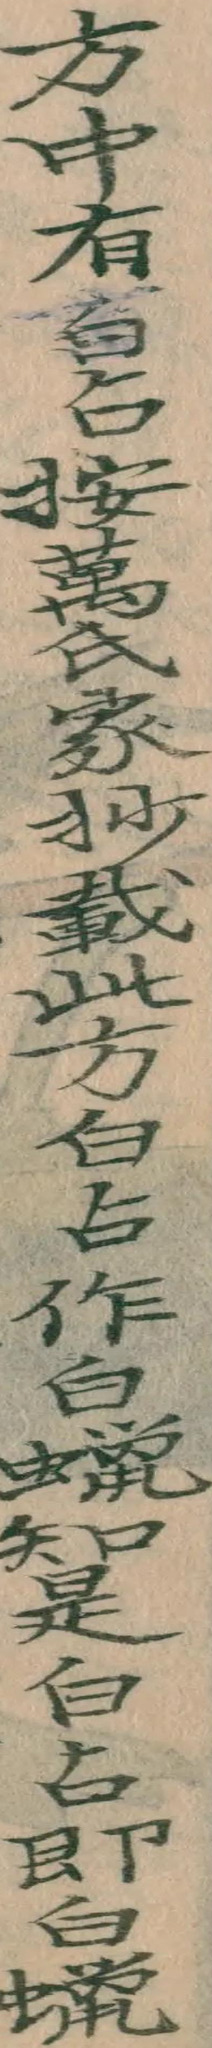方中有白占按萬氏家抄載此方白占作白蠟知是白占即白蠟
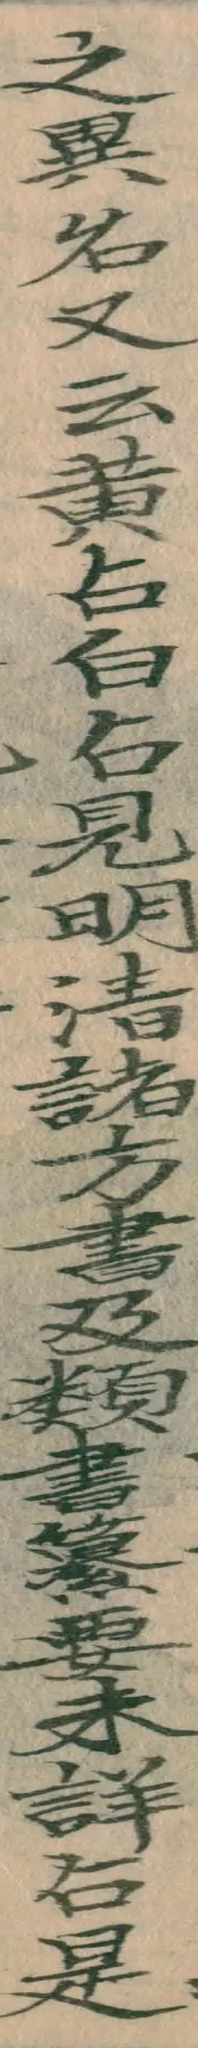之異名又云黄占白占見明清諸方書及類書纂要未詳占是
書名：千蟲譜 3巻. [1]
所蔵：国立国会図書館 National Diet Library, JAPAN
